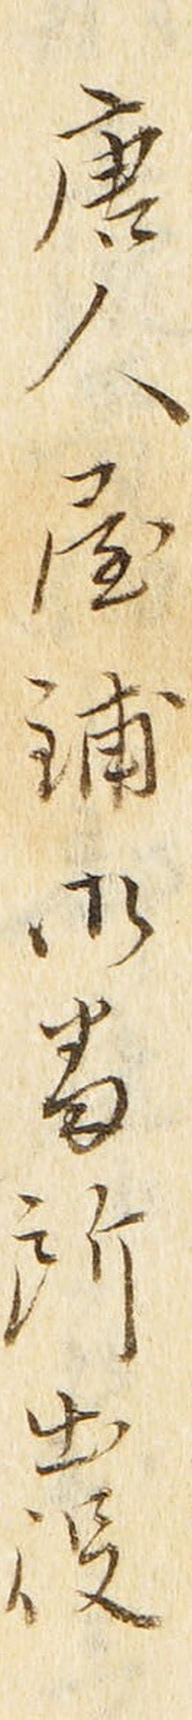唐人屋舖御番所出役
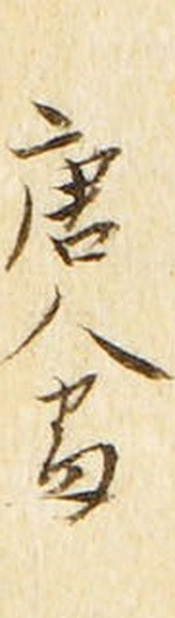唐人番
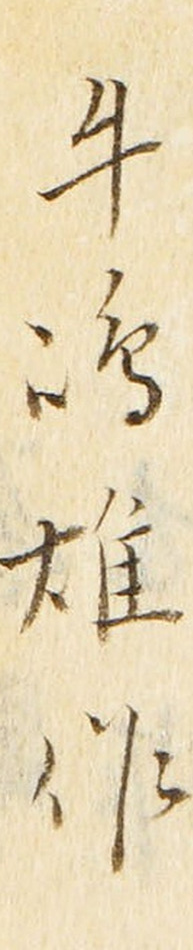牛嶋雄作
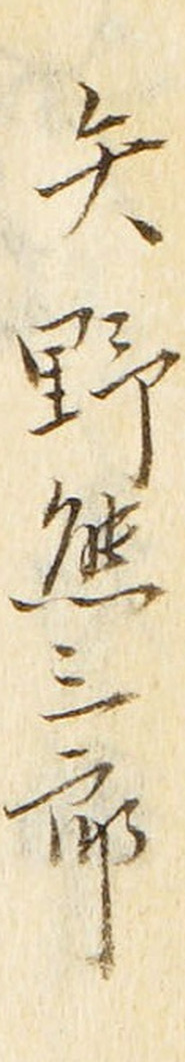矢野熊三郎
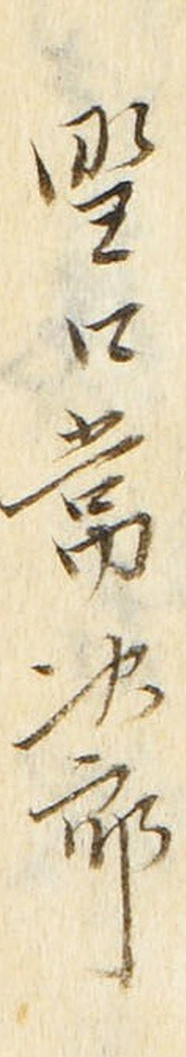野口常次郎
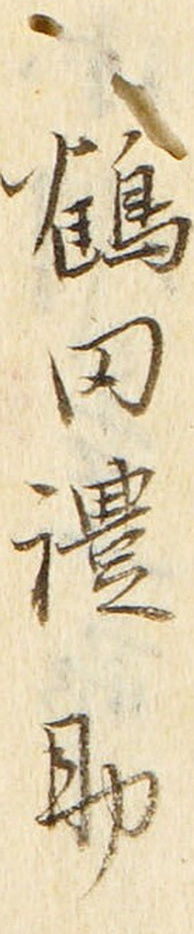鶴田礼助

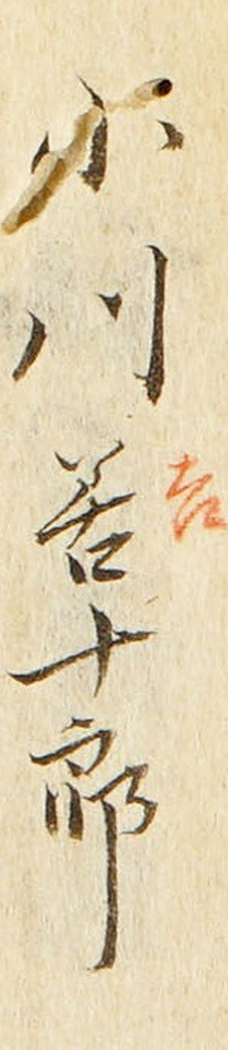小川善十郎
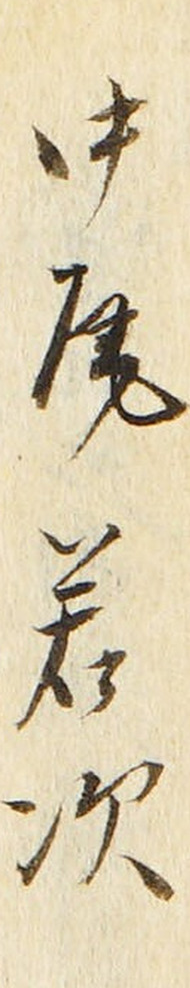中尾若次
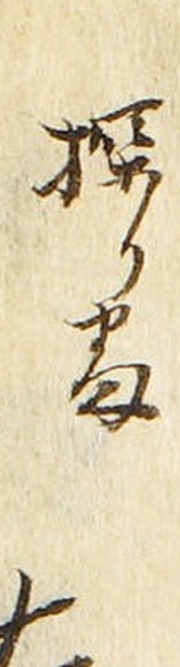摂り番
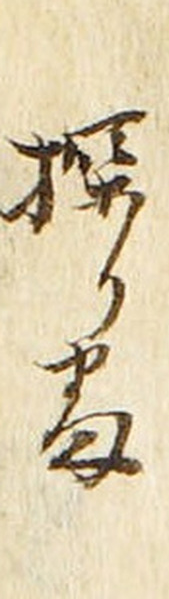摂り番
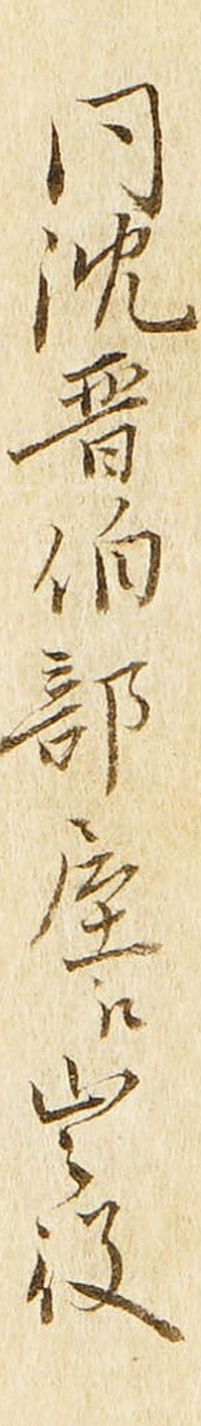同沈晋伯部屋候山之役
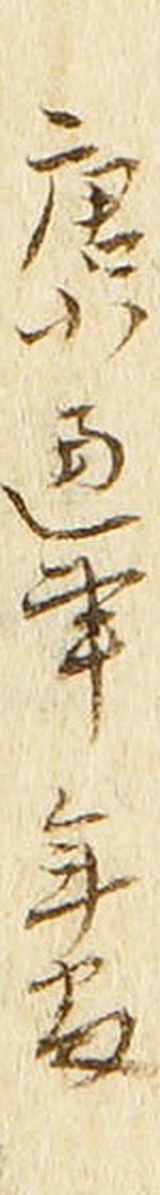唐小通事年番
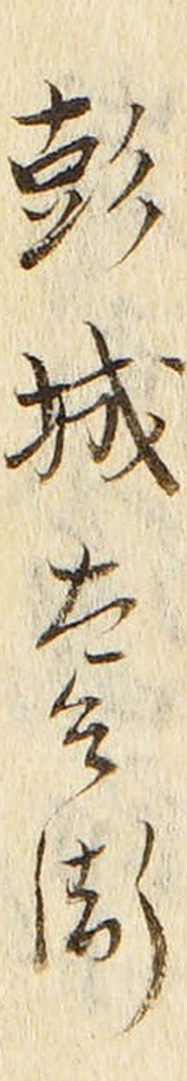彭城太兵衛
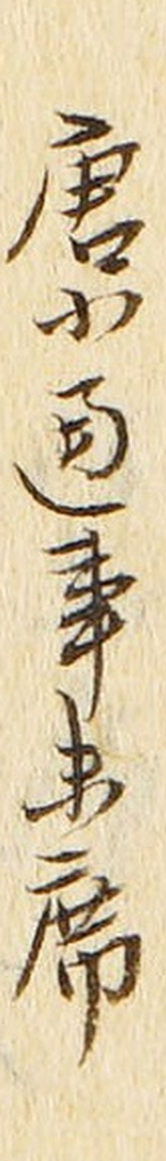唐小通事末席
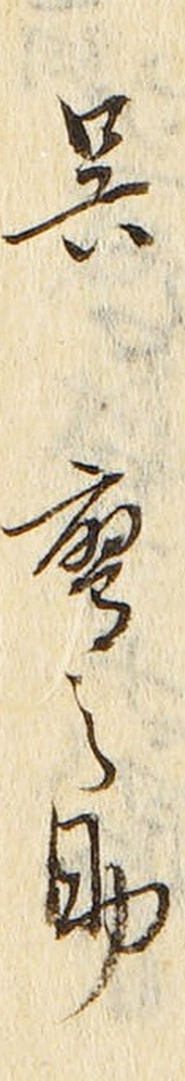呉廌之助
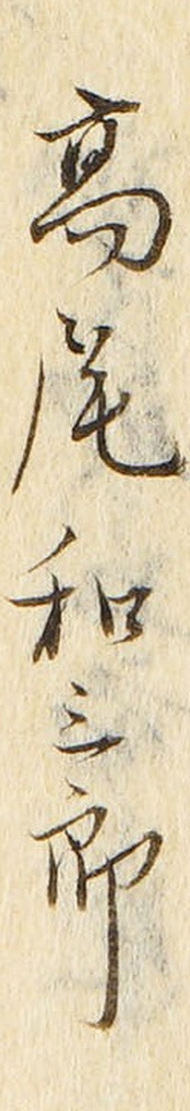高尾和三郎
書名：長崎漂流記
